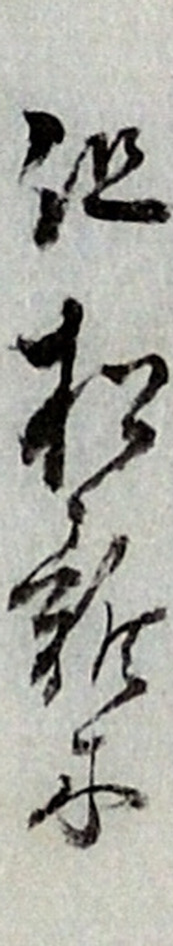但松雑木
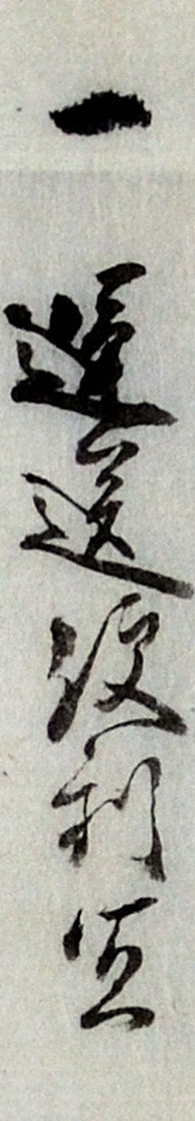一運送便利宜
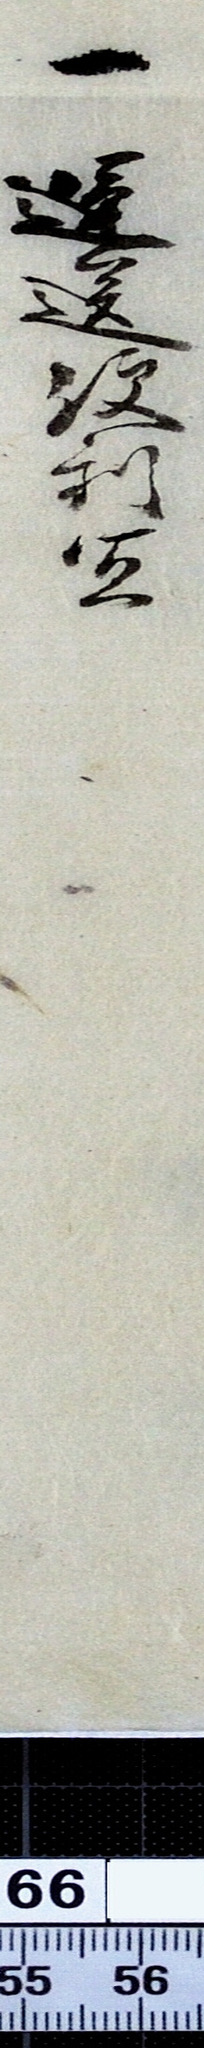一運送便利宜
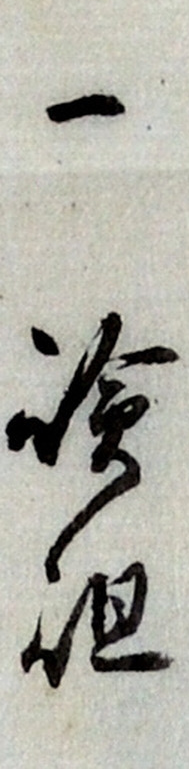一嶮岨
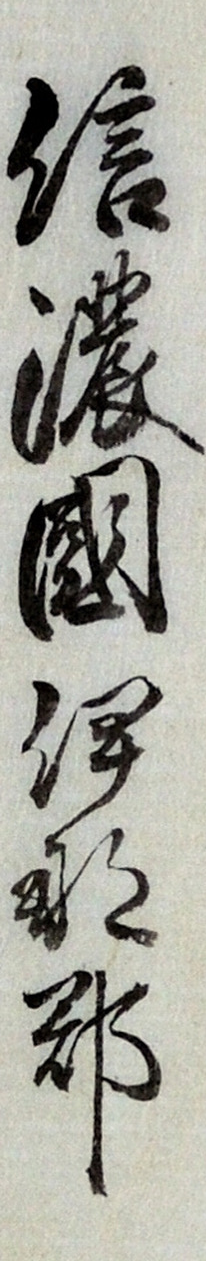信濃国伊那郡
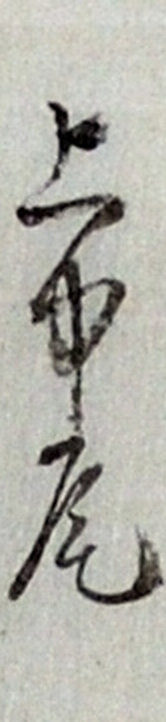上中尾
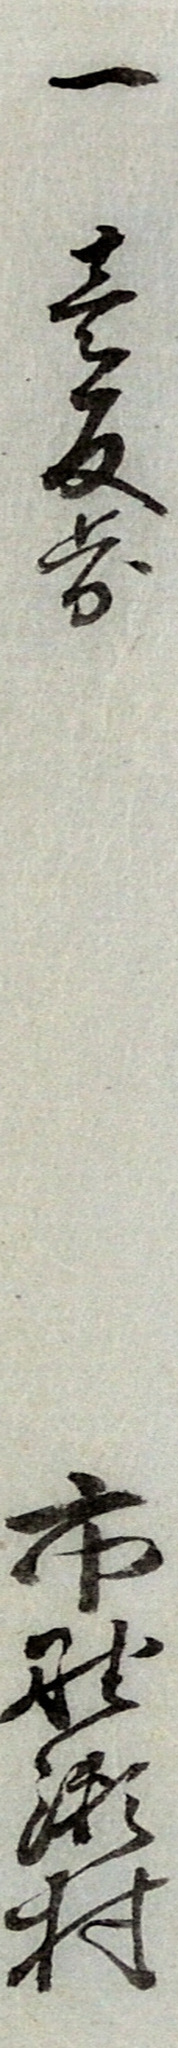一壱反歩市野瀬村
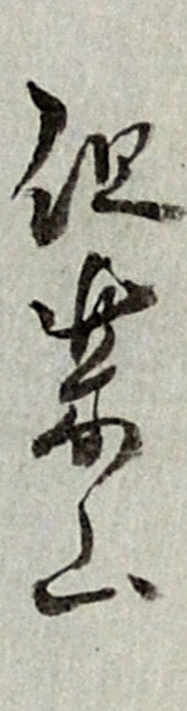但柴山
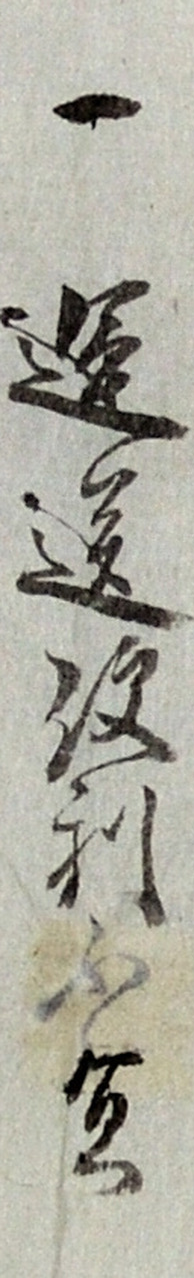一運送便利宜
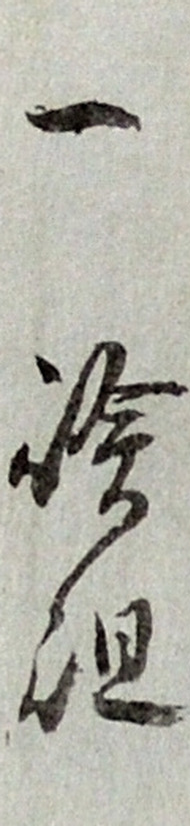一嶮岨

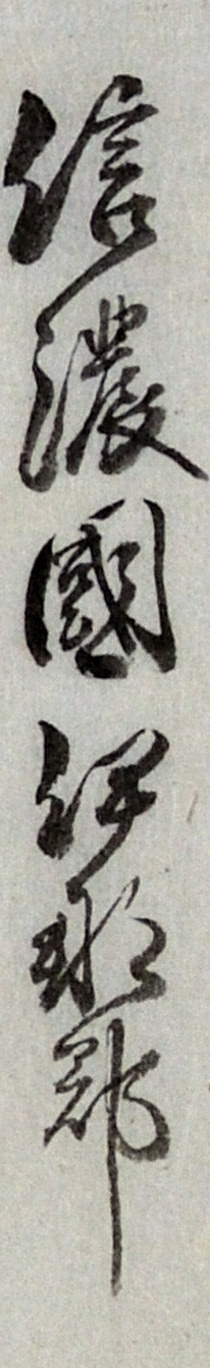信濃国伊那郡
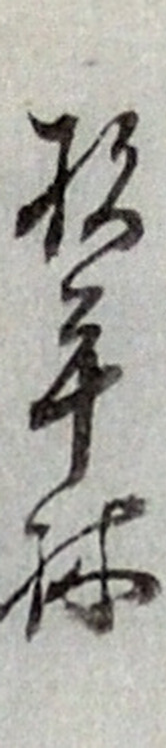杦平林
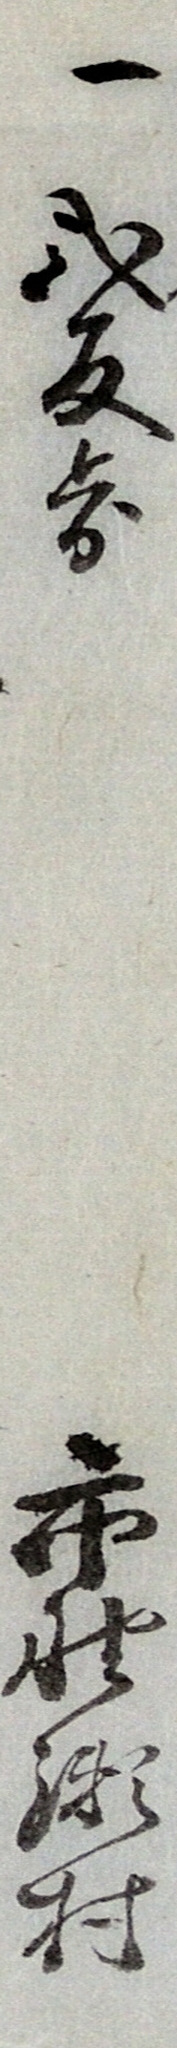一弐反歩市野瀬村
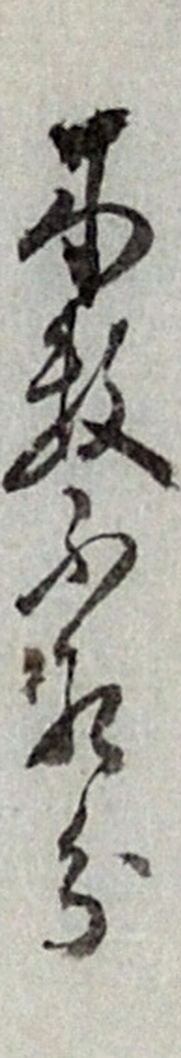木数不相分
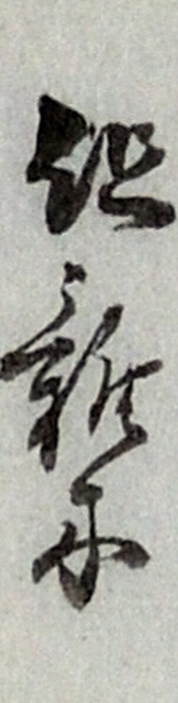但雑木
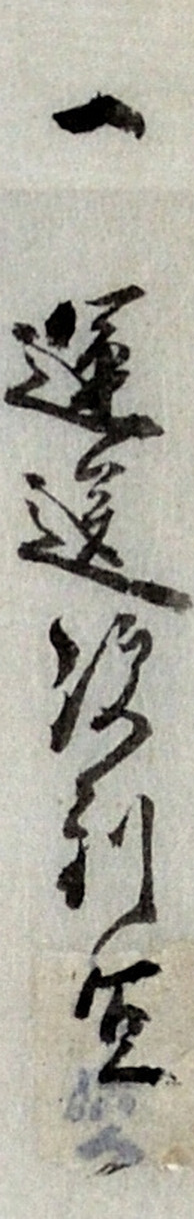一運送便利宜
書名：官林反別帳
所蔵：伊那市立高遠町図書館・合同会社AMANE
